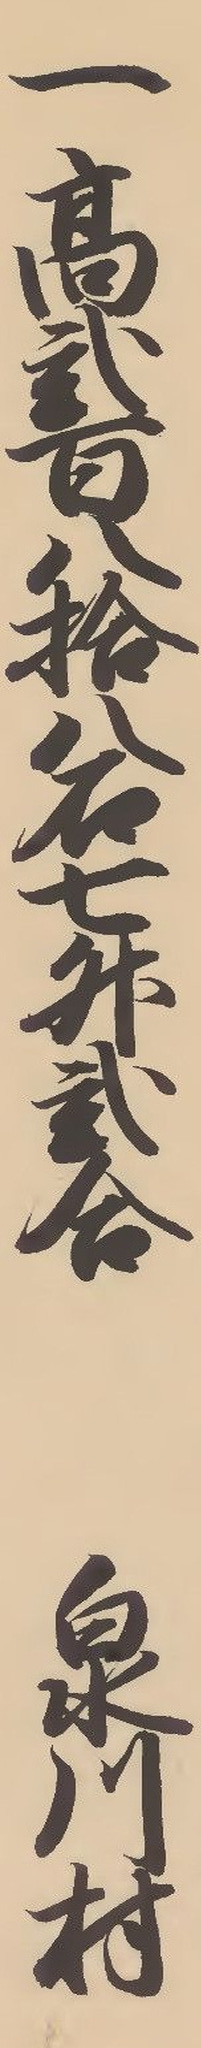一高弐百八拾八石七升弐合泉川村
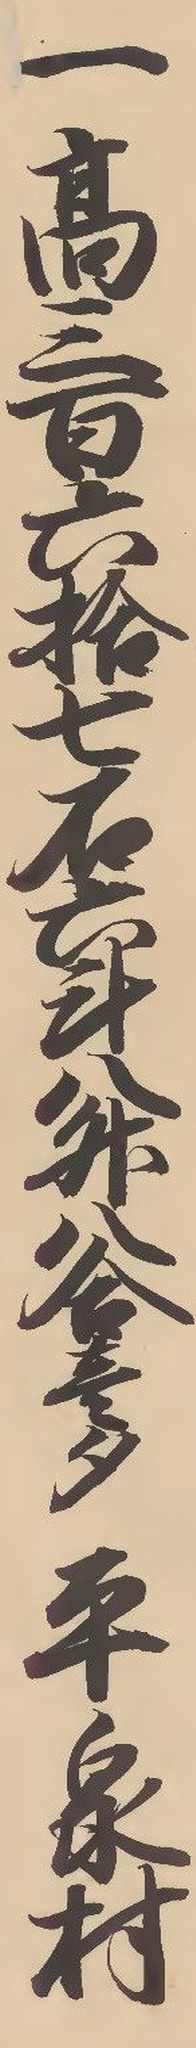一高三百六拾七石六斗八升八合壱勺平泉村
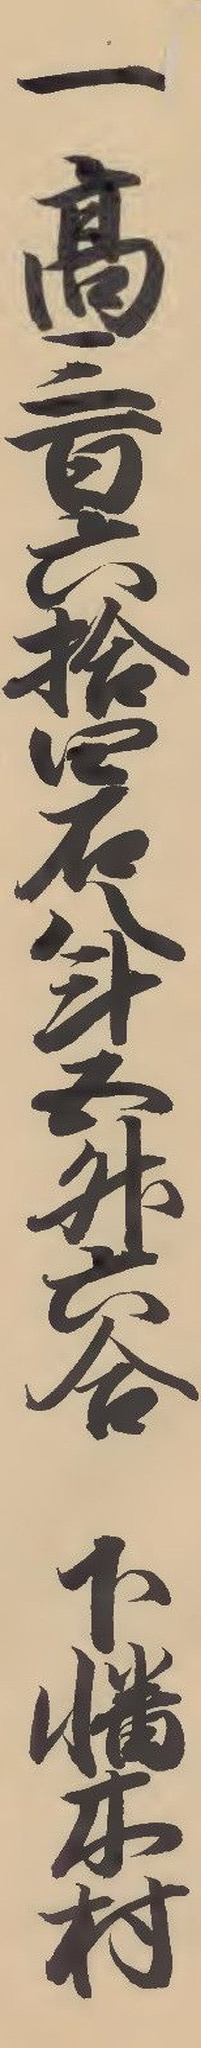一高三百六拾四石八斗五升六合下幡木村
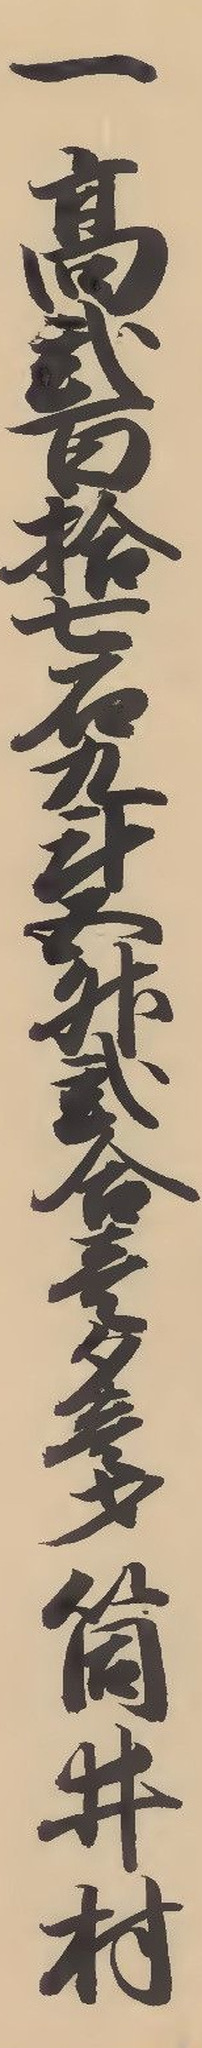一高弐百拾七石九斗五升弐合壱勺壱才筒井村
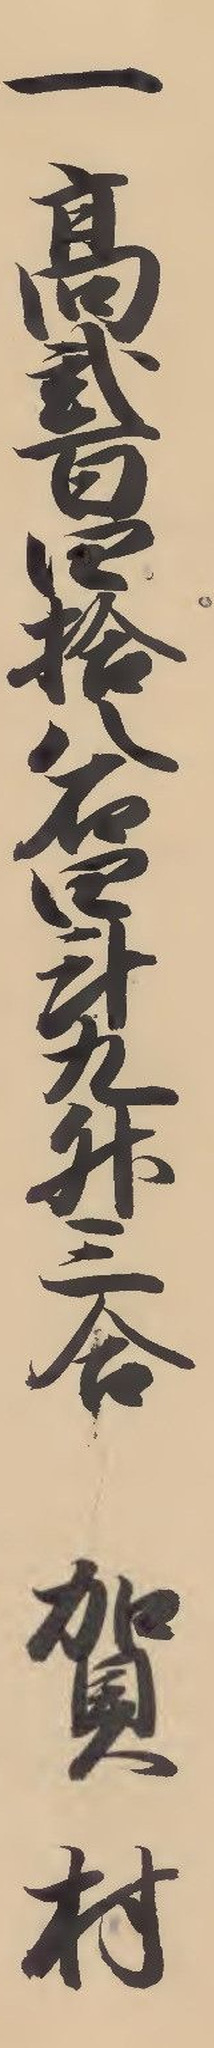一高弐百四拾八石四斗九升三合賀村
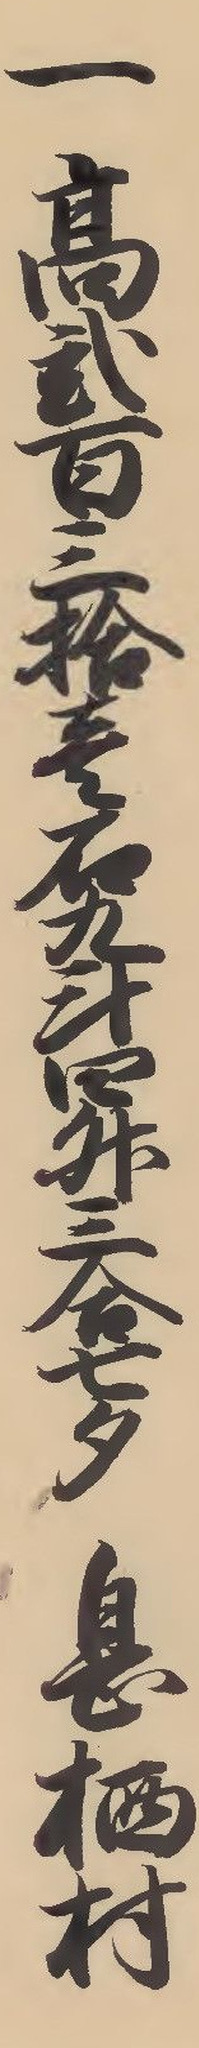一高弐百三拾壱石九斗四升三合七勺息栖村

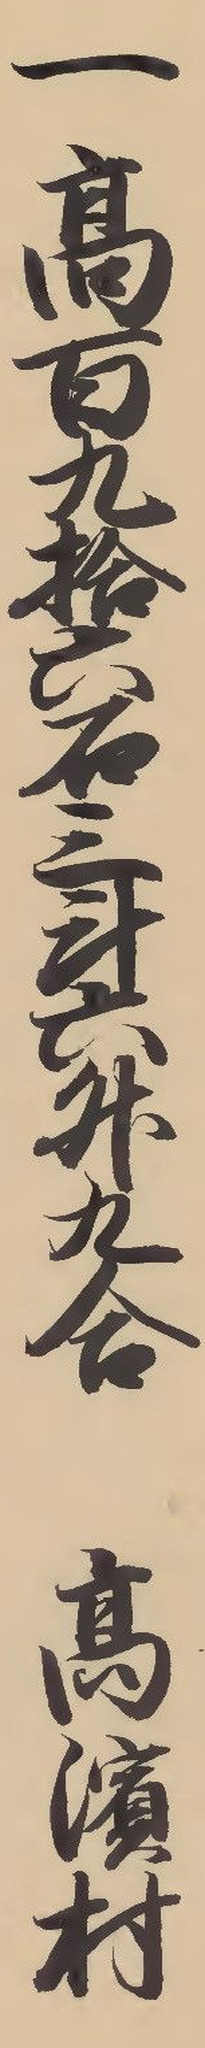一高百九拾六石三斗六升九合高浜村
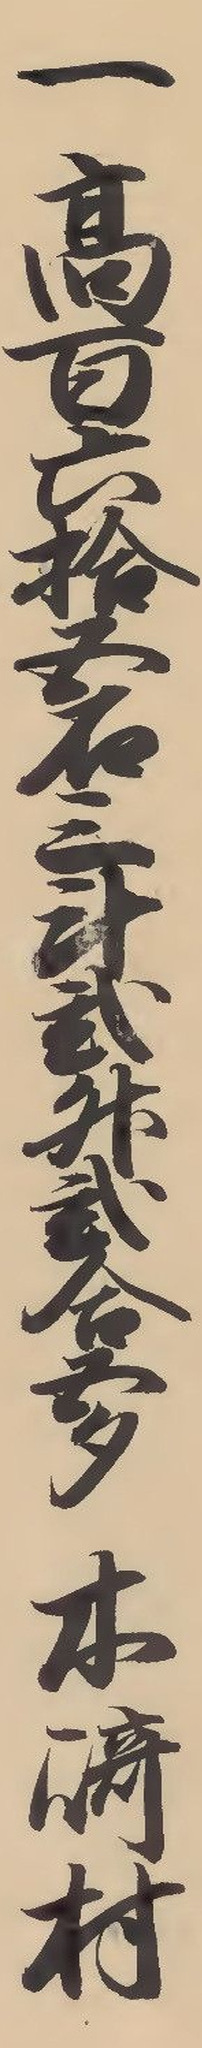一高百六拾五石三斗弐升弐合五勺木崎村
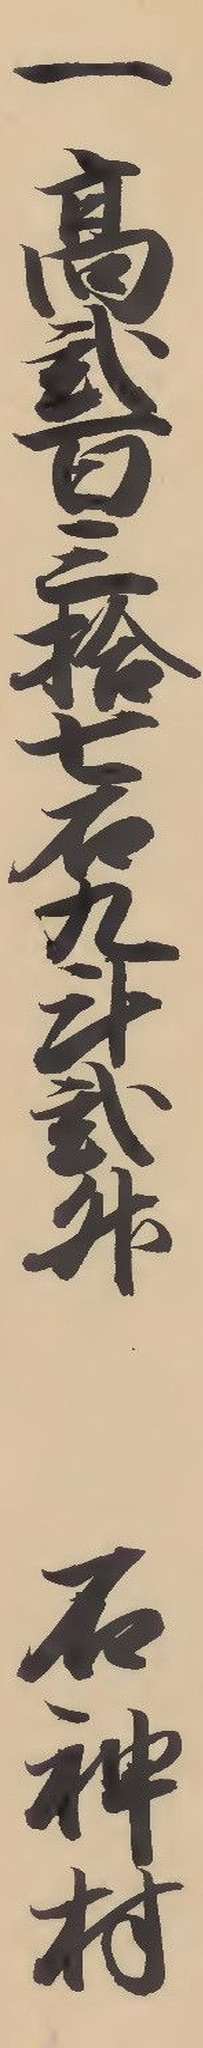一高弐百三拾七石九斗弐升石神村
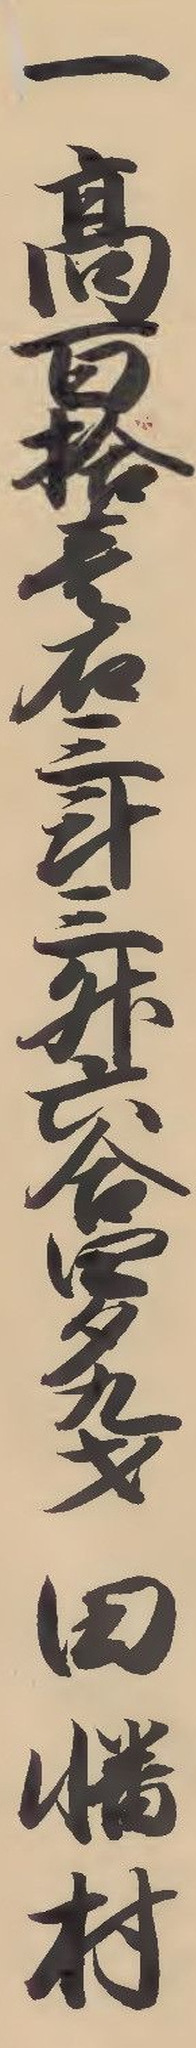一高百拾壱石三斗三升六合四勺九才田幡村
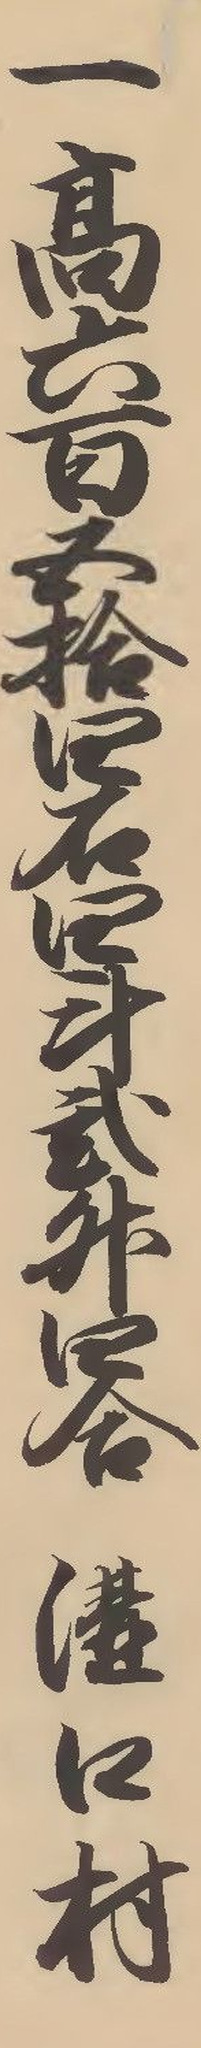一高六百五拾四石四斗弐升四合溝口村
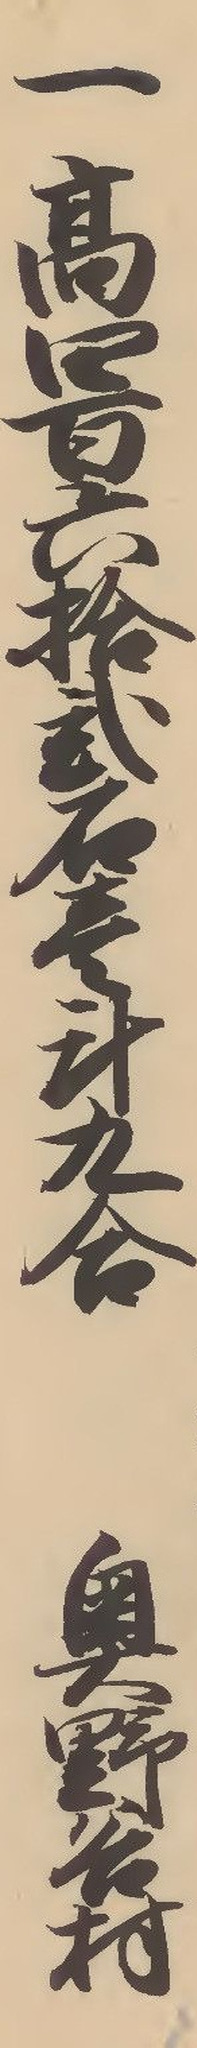一高四百六拾弐石壱斗九合奥野谷村
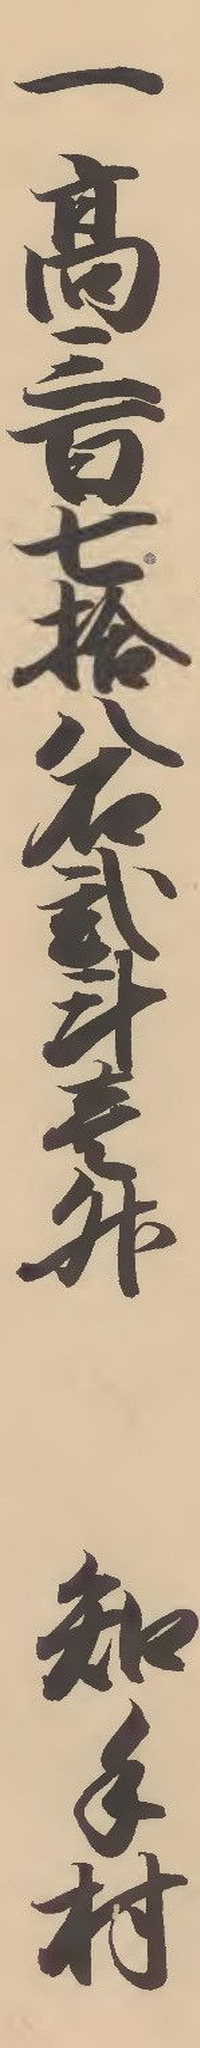一高三百七拾八石弐斗壱升知手村
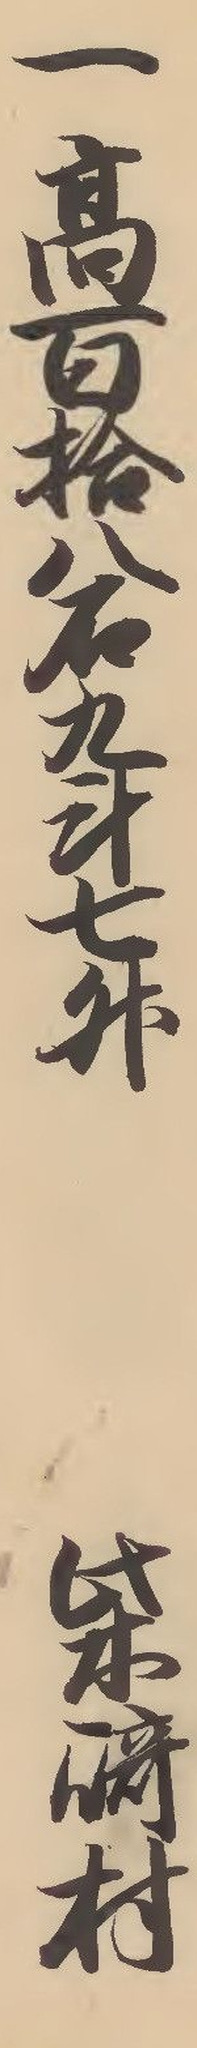一高百拾八石九斗七升柴崎村

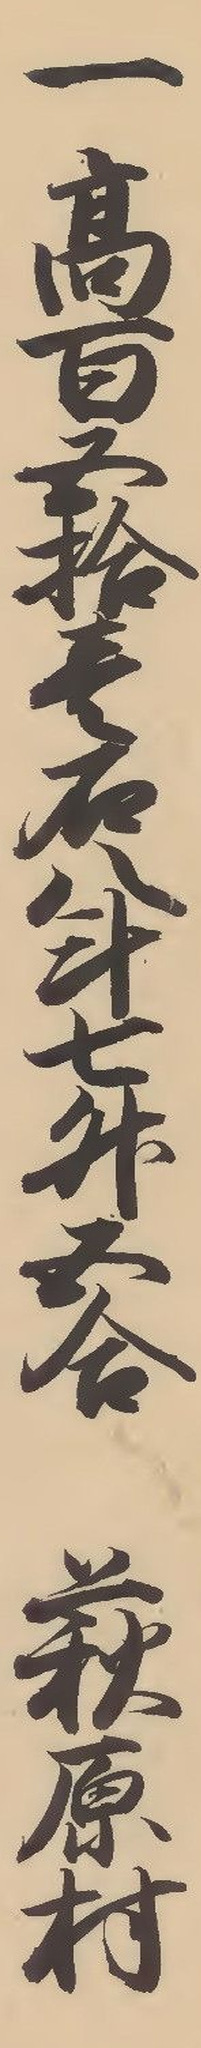一高百五拾壱石八斗七升五合萩原村
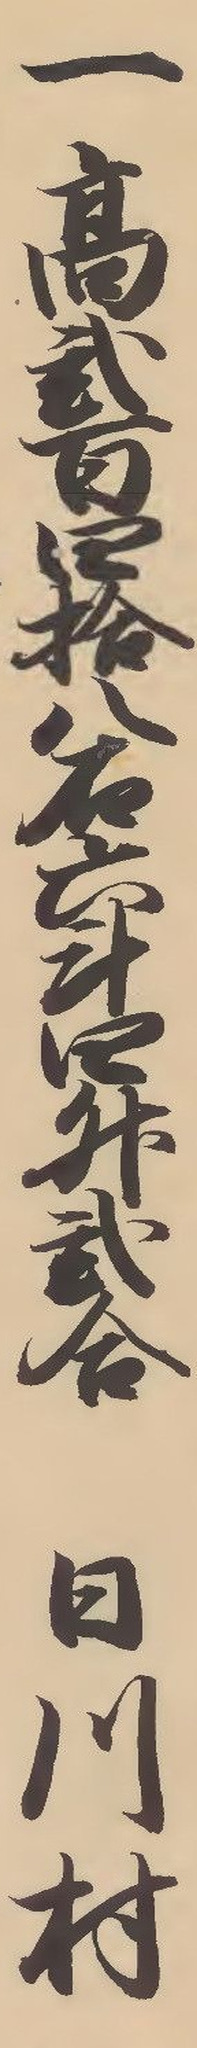一高弐百四拾八石六斗四升弐合日川村
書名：常陸国郷帳
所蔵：国立公文書館 National Archives of Japan
